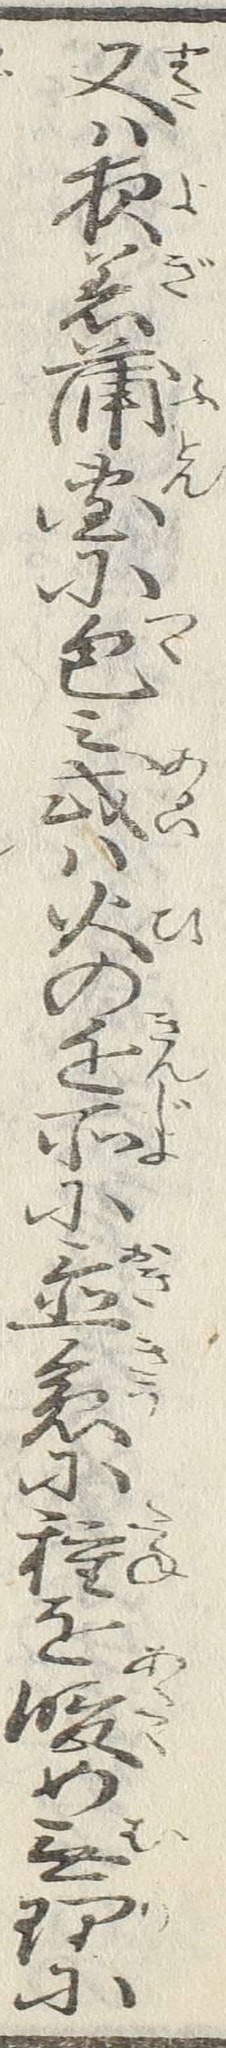又は夜着蒲団に包み或は火の近所に置急に種を暖め無理に
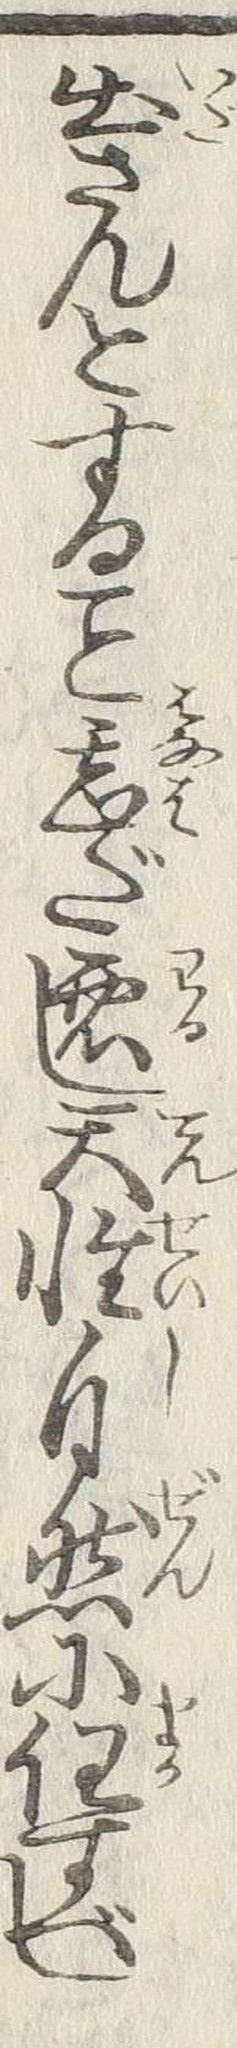出さんとすること甚だ悪し天性自然に任すべし
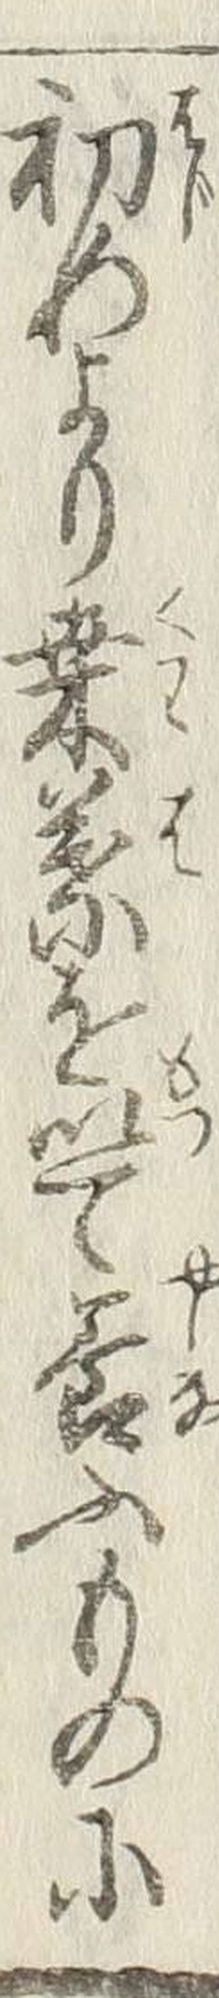初めより桑葉を以て養ふものに
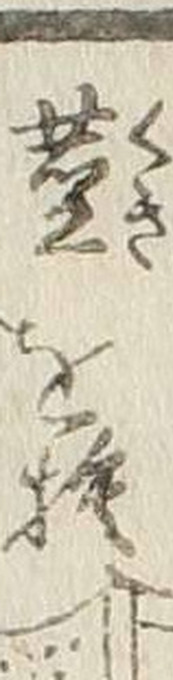茎を捨
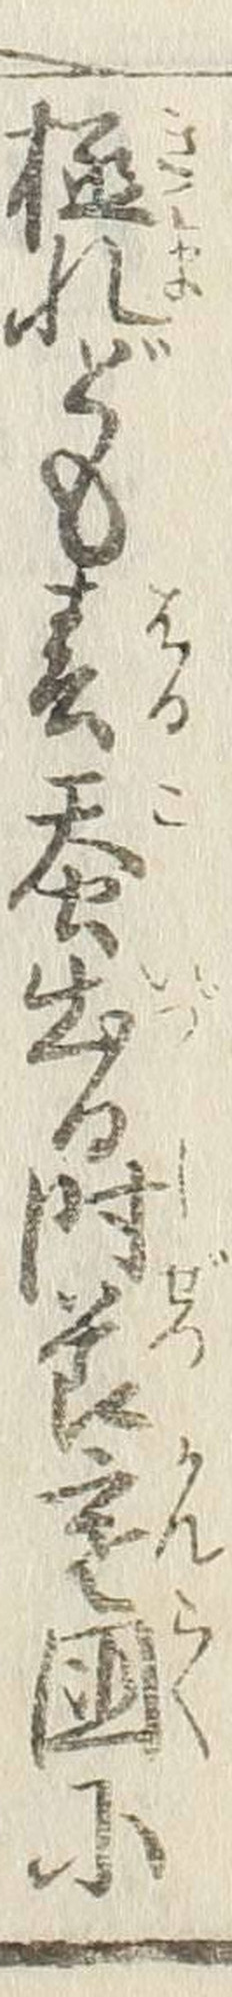極れども春蚕出る時節寒國に
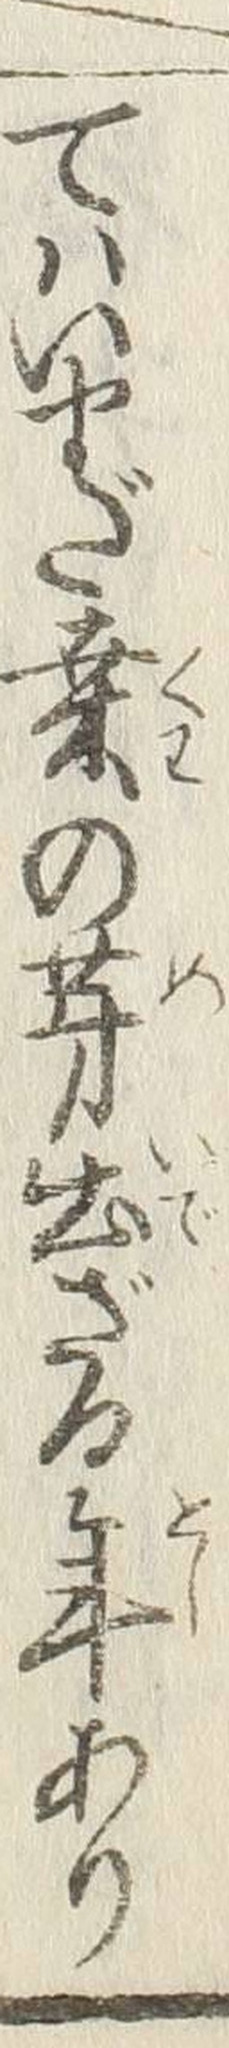てはいまだ桑の芽出ざる年あり
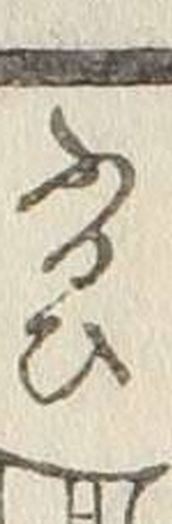ふるひ
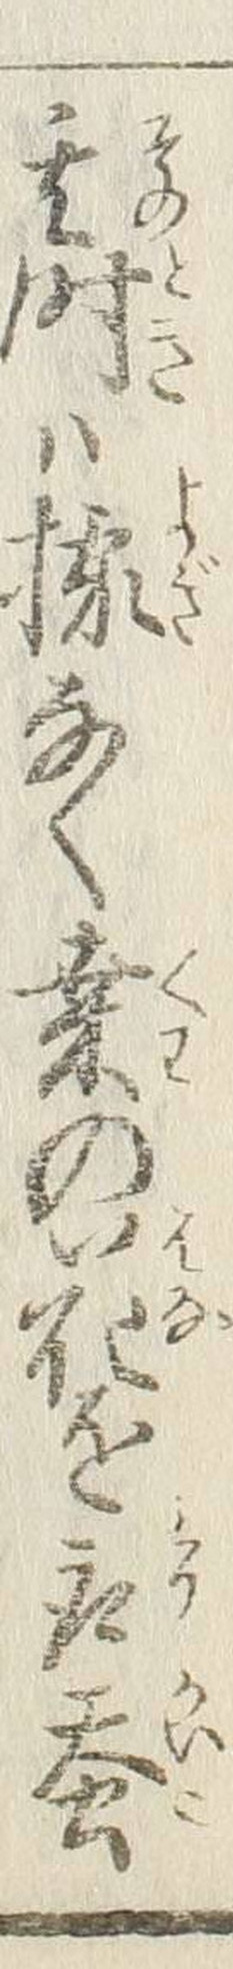其時は據なく桑の花を取蚕
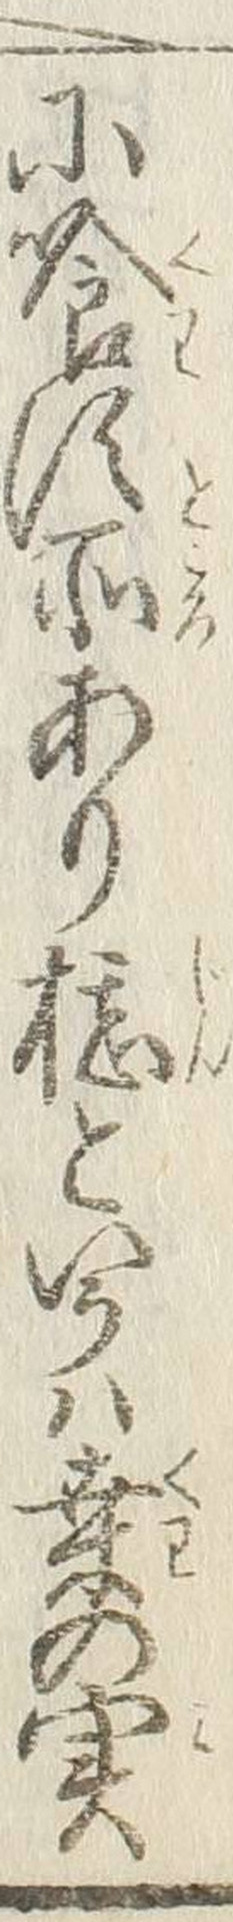に喰す所あり椹というは桑の実
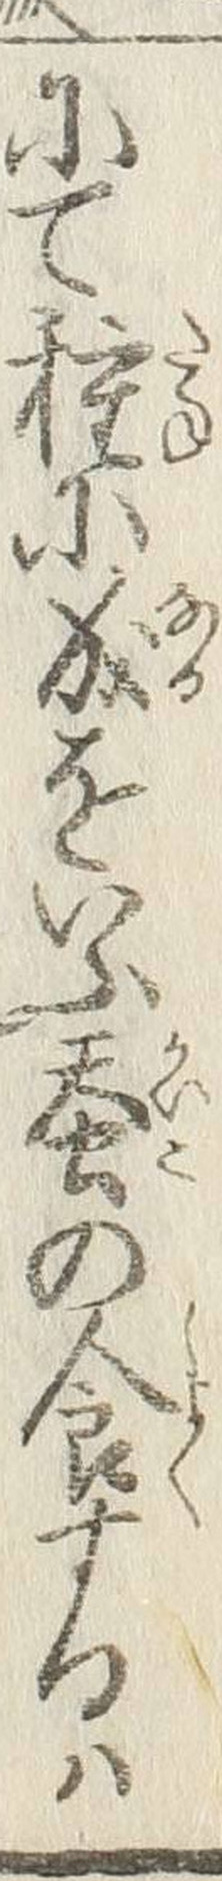にて種に成をいふ蚕の食するは
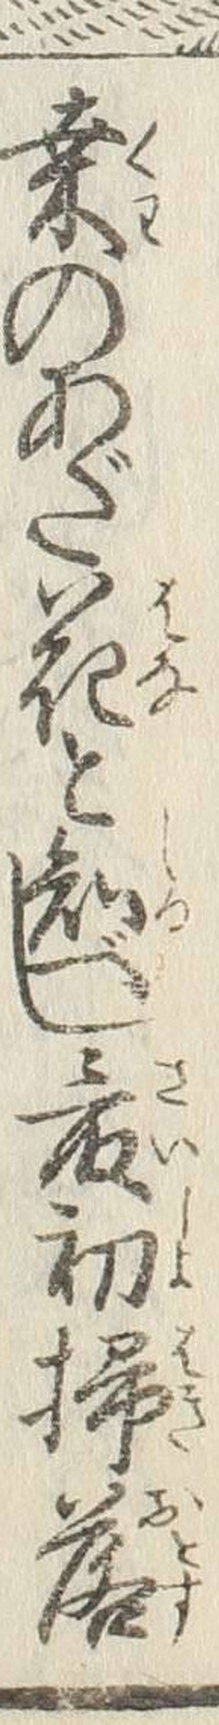桑のあだ花と知べし最初掃落
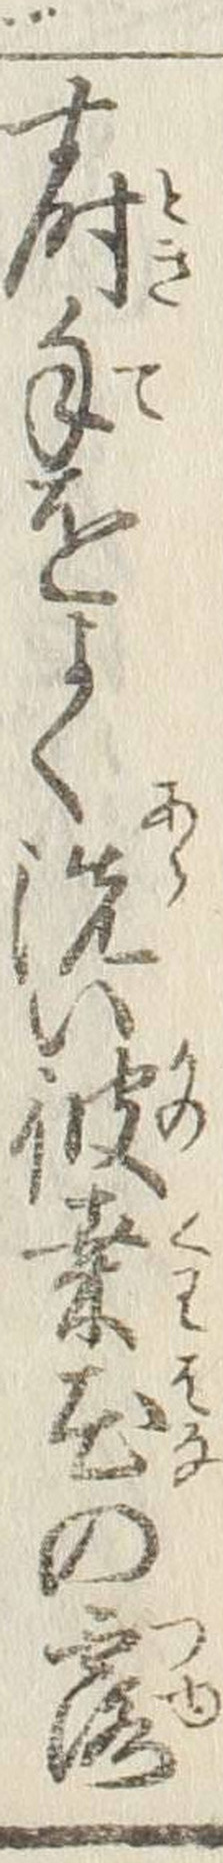す時手をよく洗い彼桑花の露
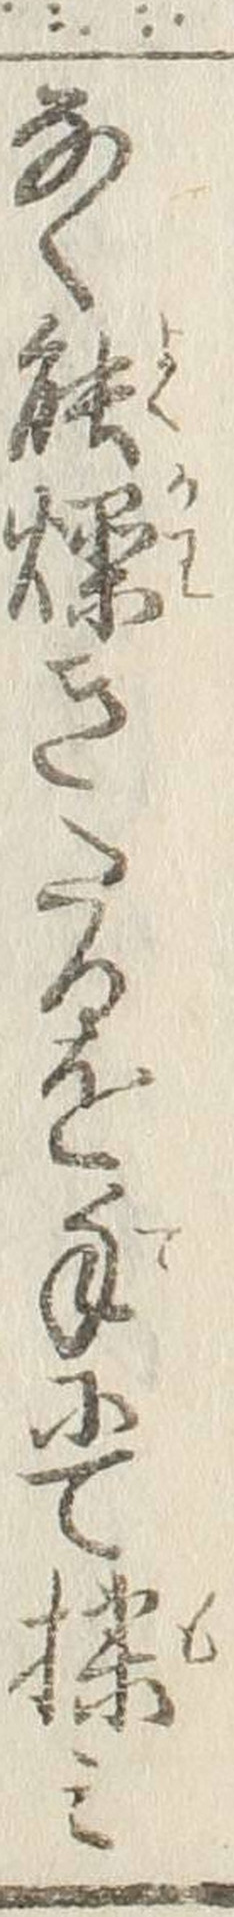なく能燥きたるを手にて揉み
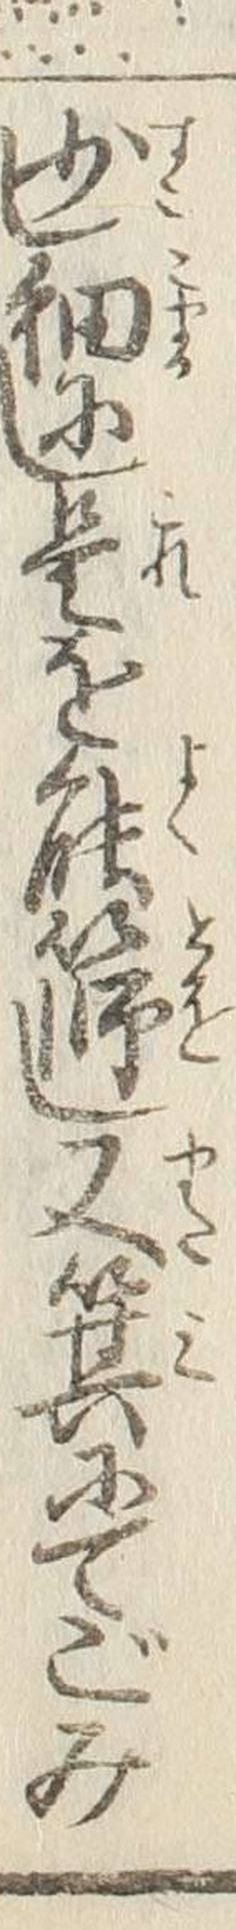少し細にし是を能篩し又箕にてごみ

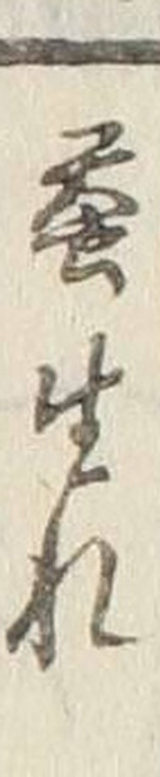蚕生れ
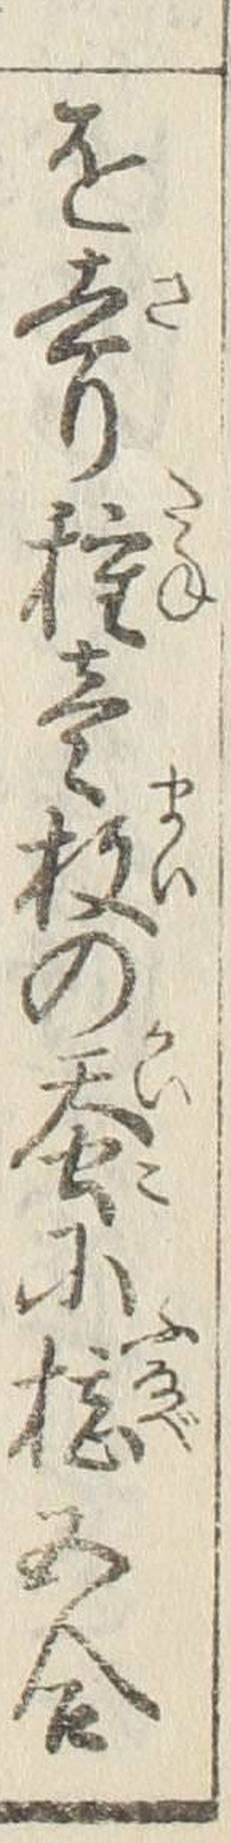を去り種壱枚の蚕に椹五合
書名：養蠶實驗録
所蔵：東京大学農学生命科学図書館 国文学研究資料館
